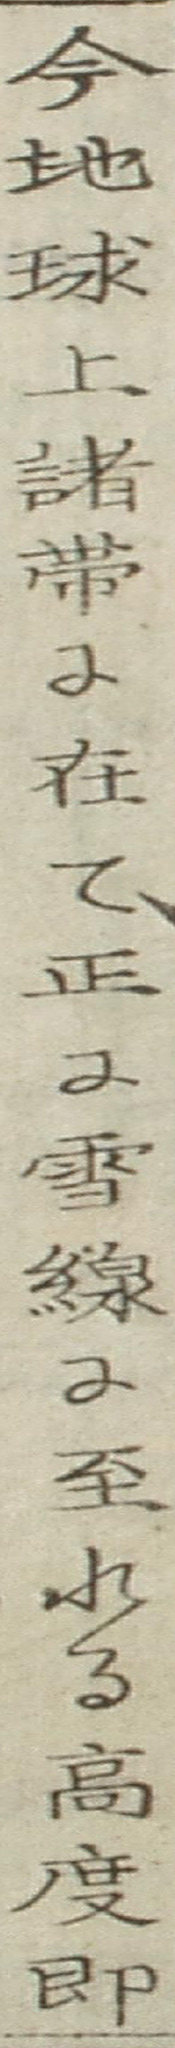今地球上諸帯に在て、正に雪線に至れる高度即
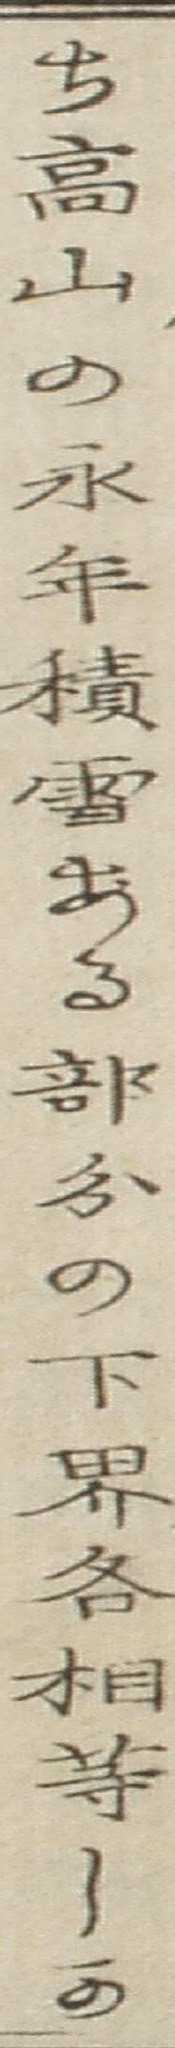ち高山の永年積雪ある部分の下界、各相等しか
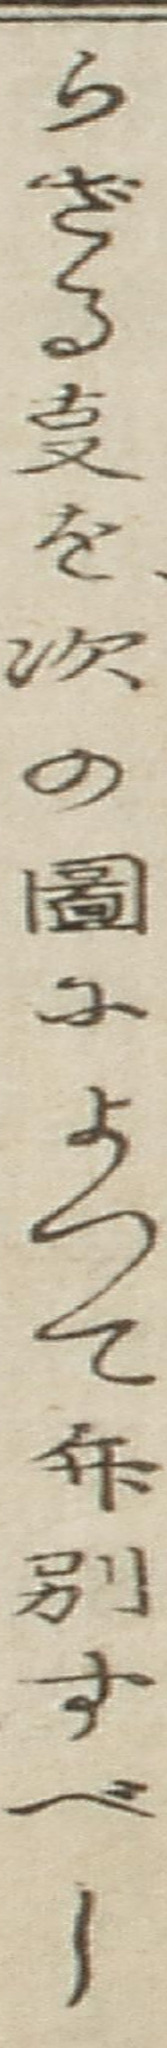らざる事を次の図によつて弁別すべし

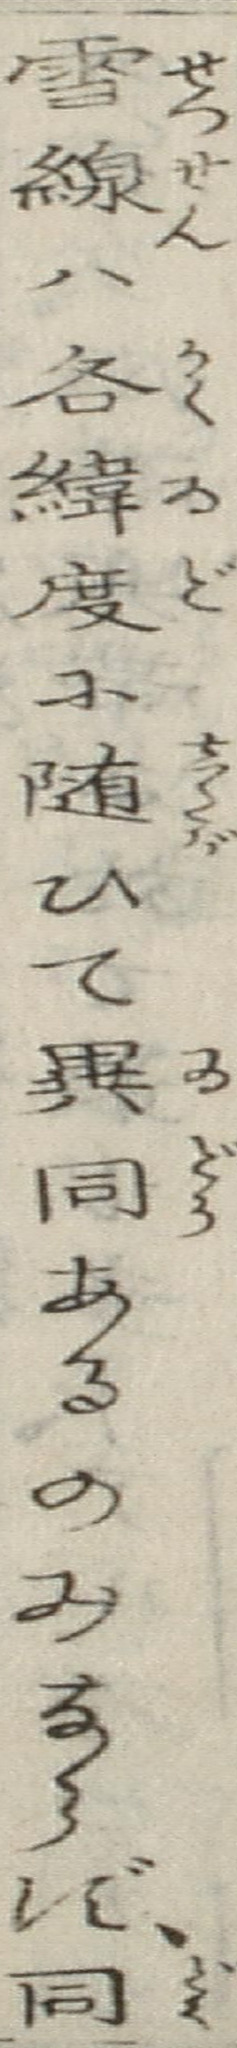雪線は各緯度に随ひて異同あるのみならず、同
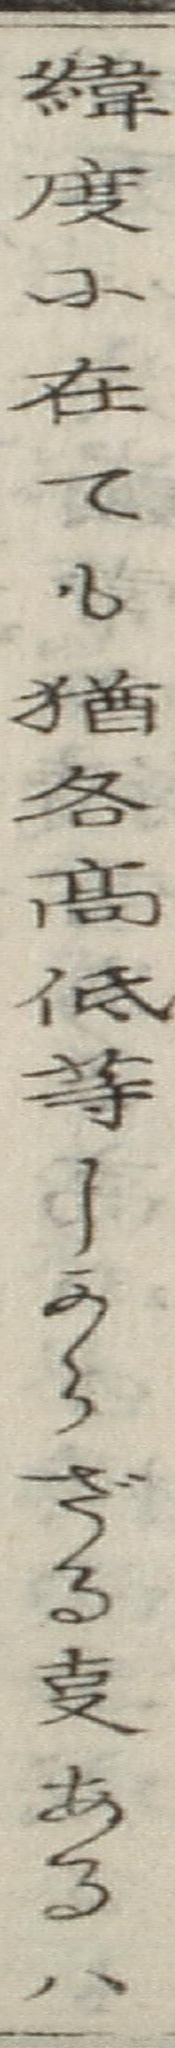緯度に在ても猶各高低等しからざる事あるは
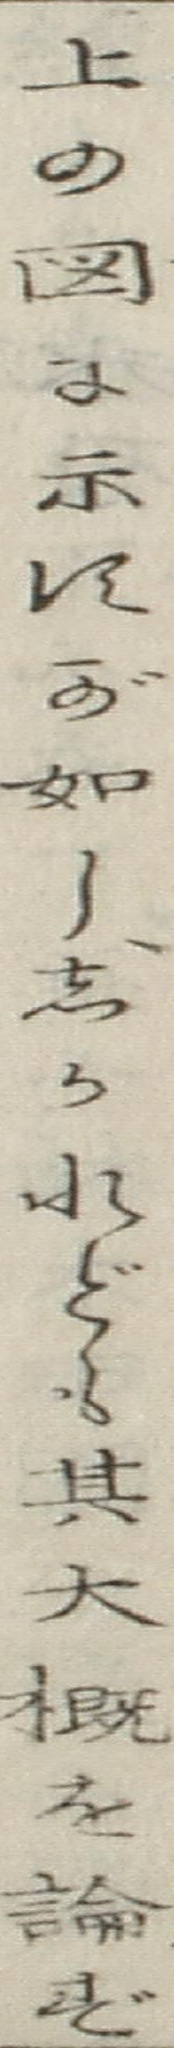上の図に示すが如し、しかれども其大概を論ず
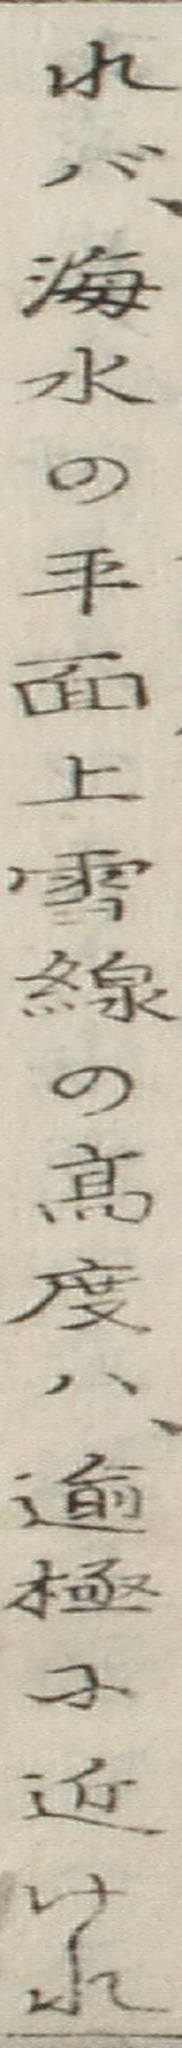れば、海水の平面上雪線の高度は、逾極に近けれ
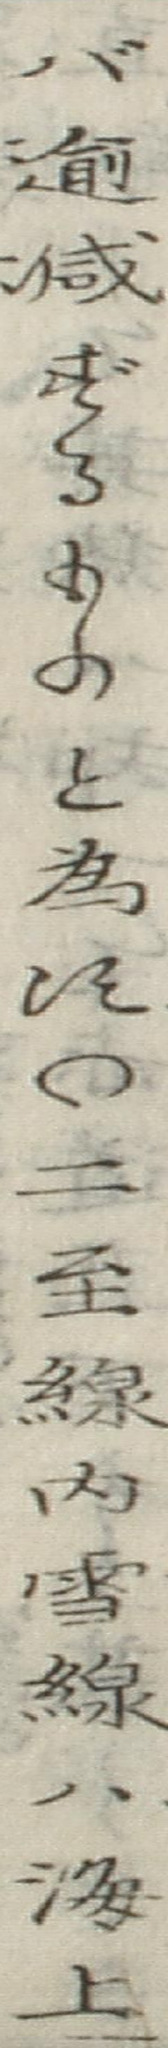ば逾減ずるものと為す、〇二至線内雪線は、海上
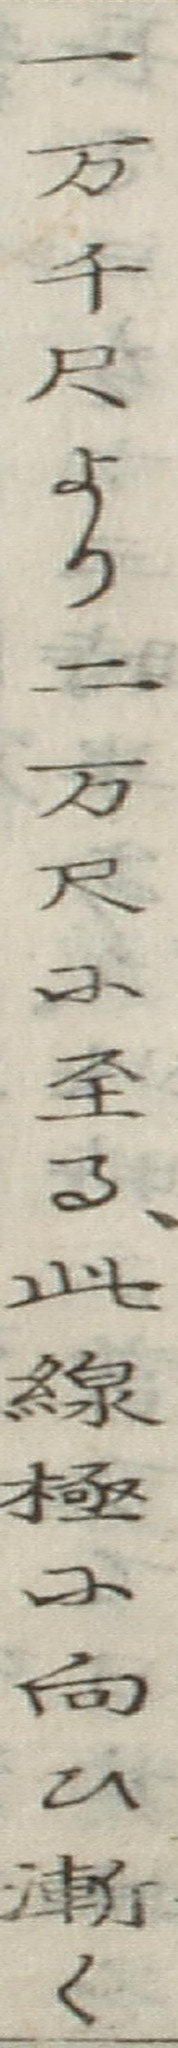一万千尺より二万尺に至る、此線極に向ひ漸く
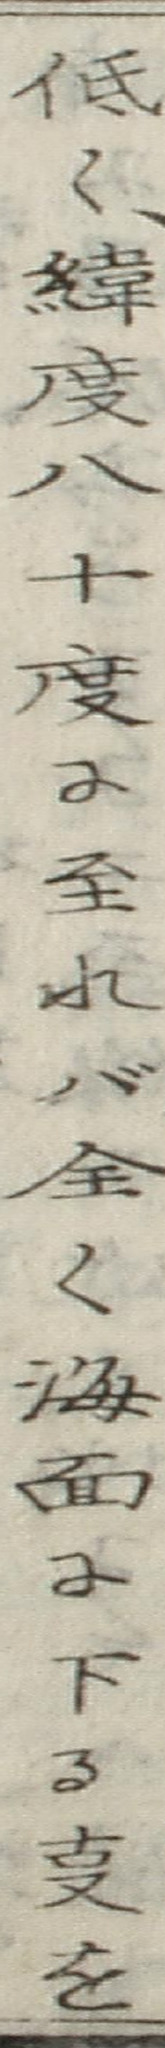低く、緯度八十度に至れば、全く海面に下る事を
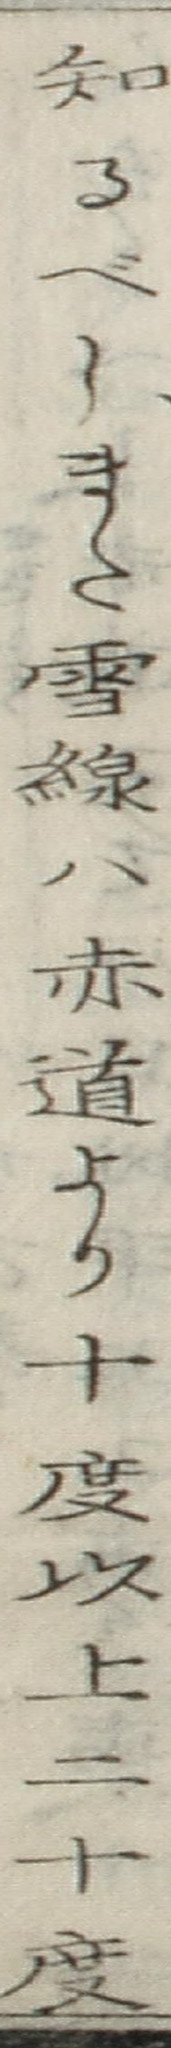知るべし、また雪線は赤道より十度以上、二十度
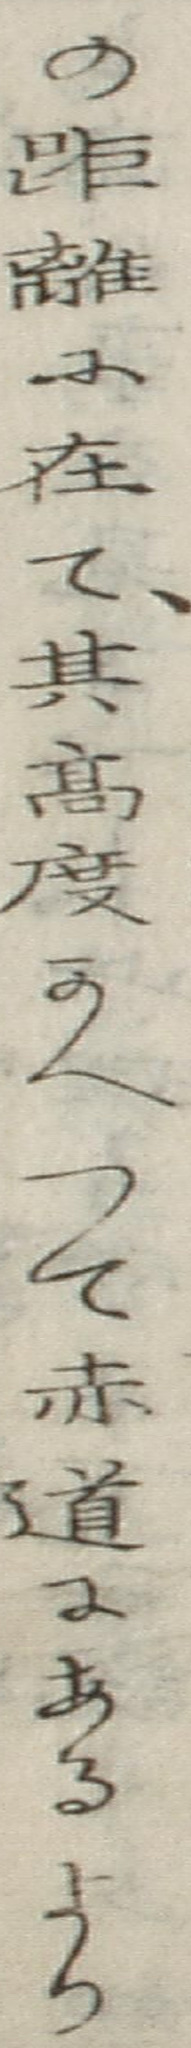の距離に在て、其高度かへつて赤道にあるより

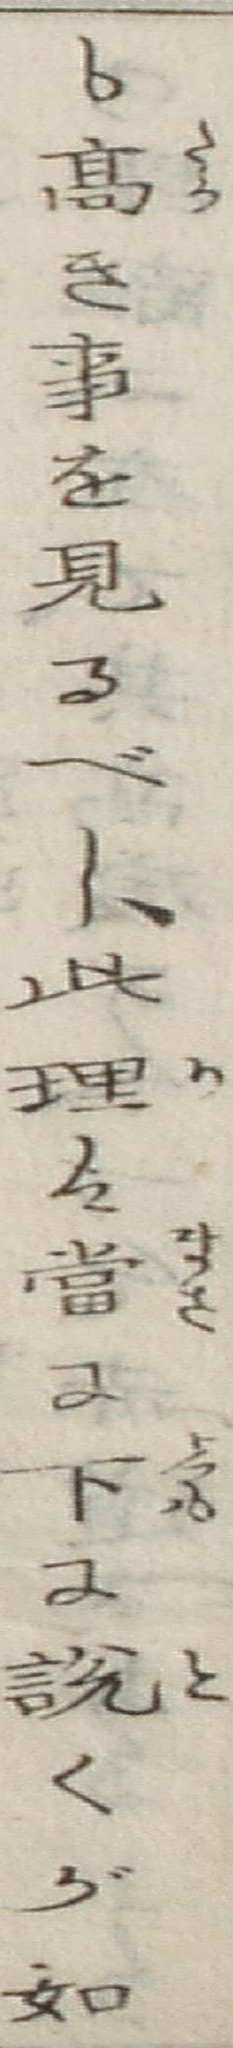も高き事を見るべし、此理は当に下に説くが如
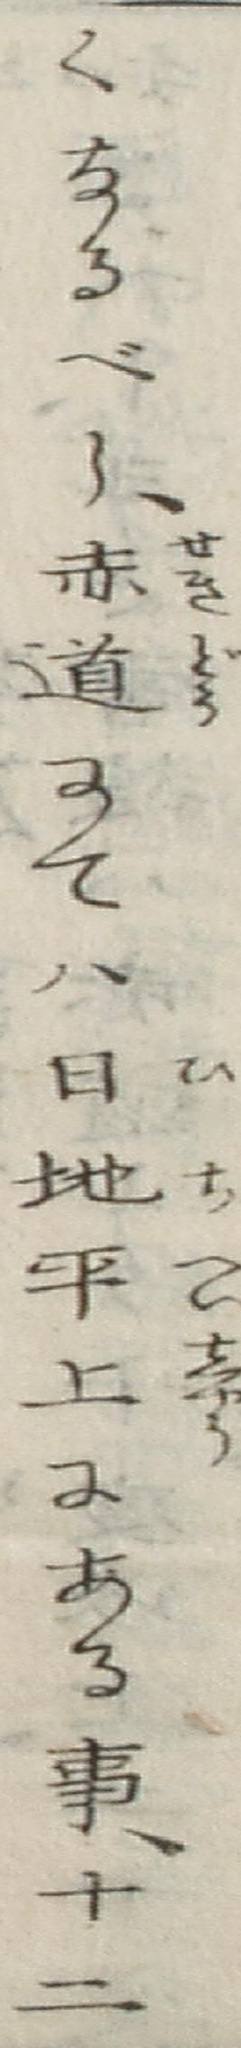くなるべし、赤道にては日地平上にある事、十二
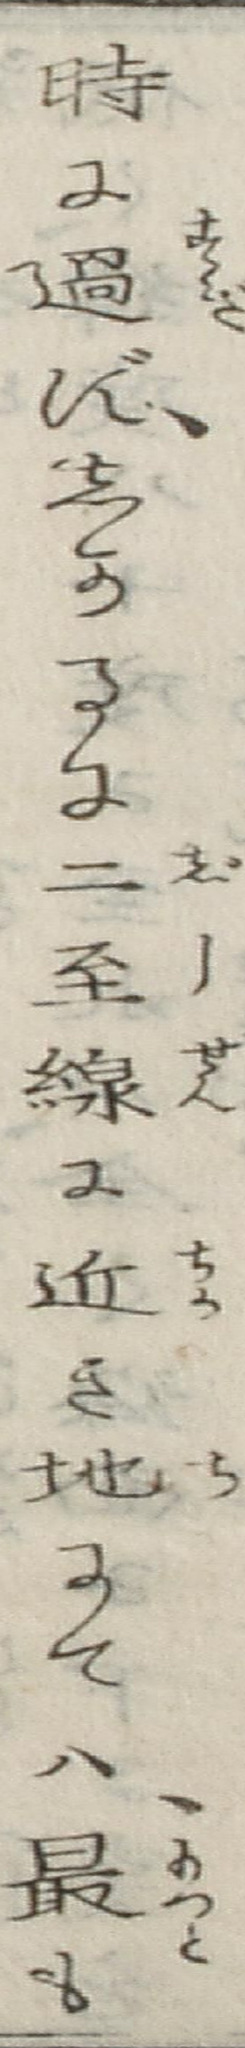時に過ず、しかるに二至線に近き地にては、最も
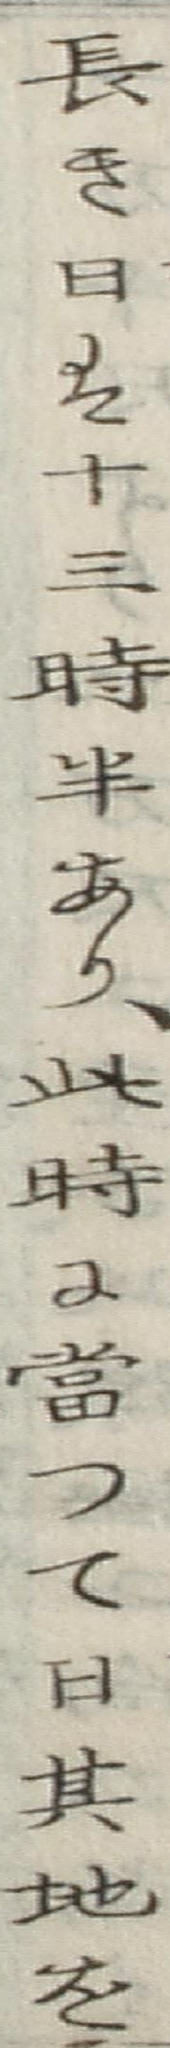長き日は十三時半あり、此時に当つて日其地を
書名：訓蒙　天然地理學　下
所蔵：東京大学地震研究所図書室 Earthquake Research Institute Library, The University of Tokyo, JAPAN
